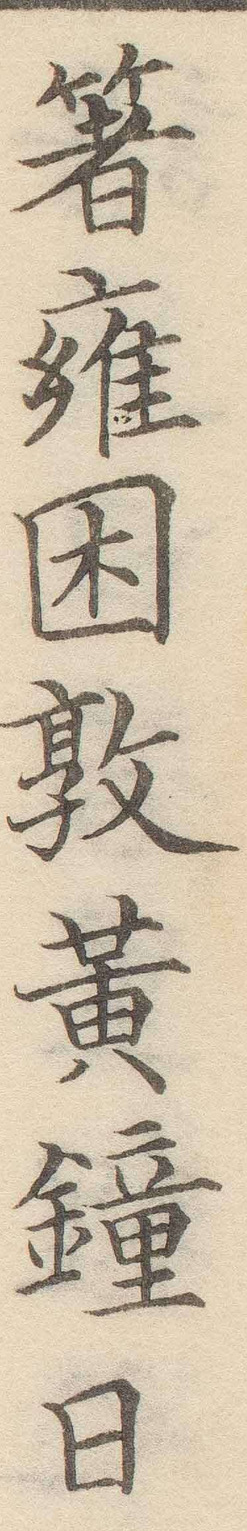箸雍困敦黄鐘日
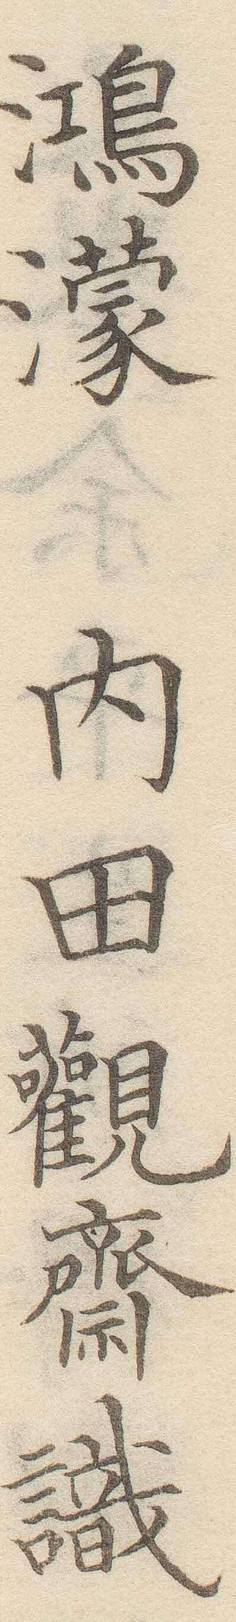鴻濛内田観斎識
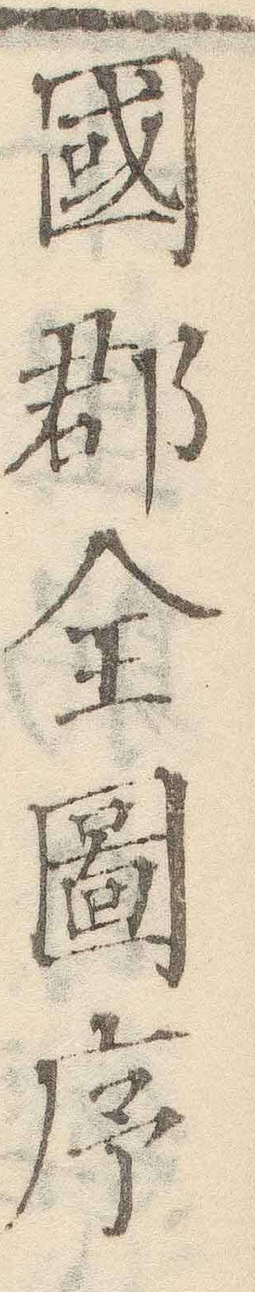国郡全図序

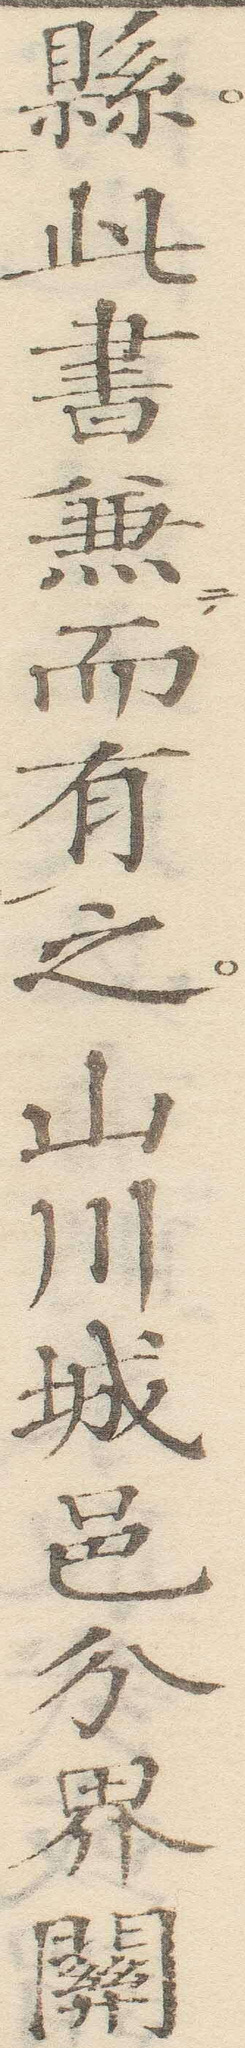県此書兼而有之山川城邑分界関

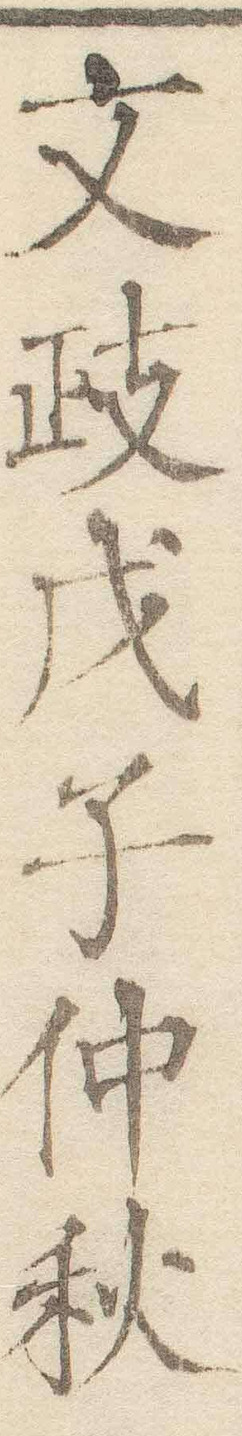文政戊子仲秋
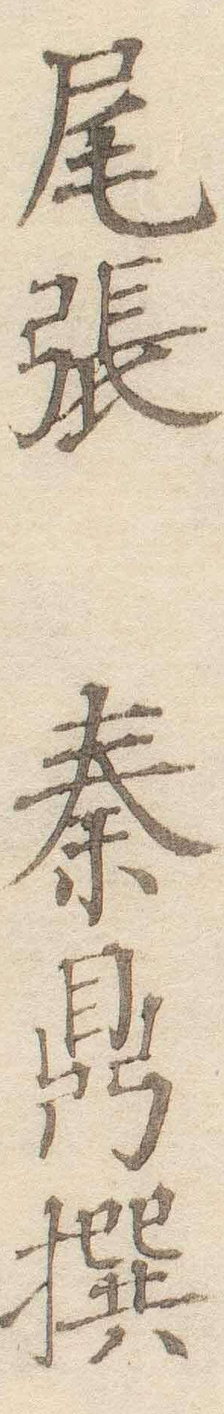尾張秦鼎撰
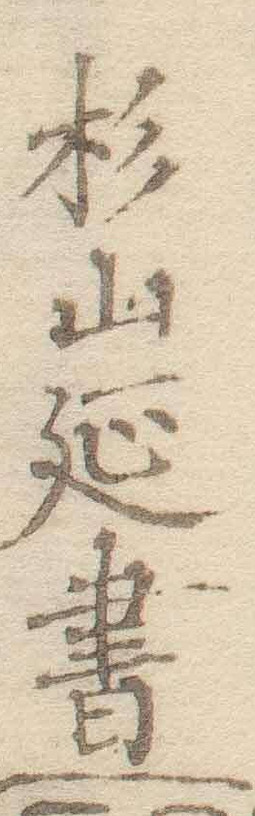杉山延書

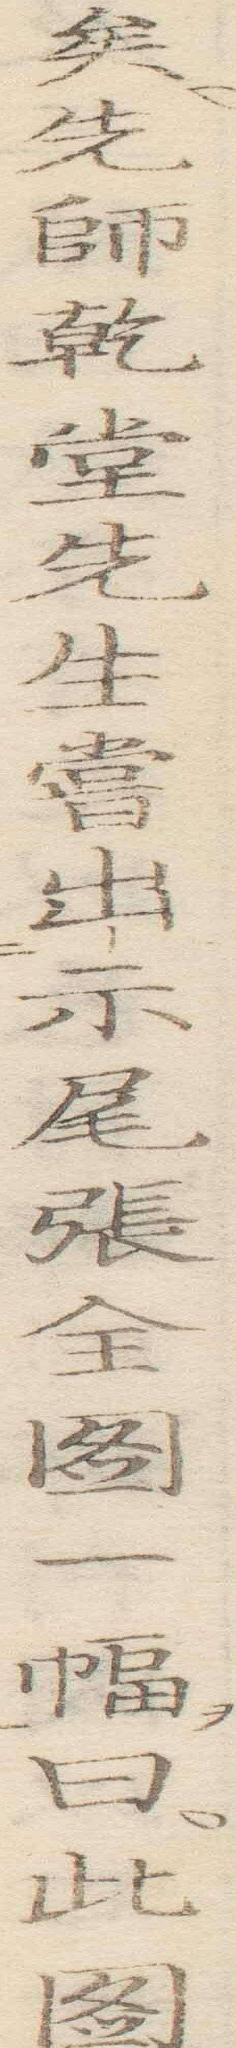矣、先師乾堂先生甞出-示尾張全図一幅曰、此図、
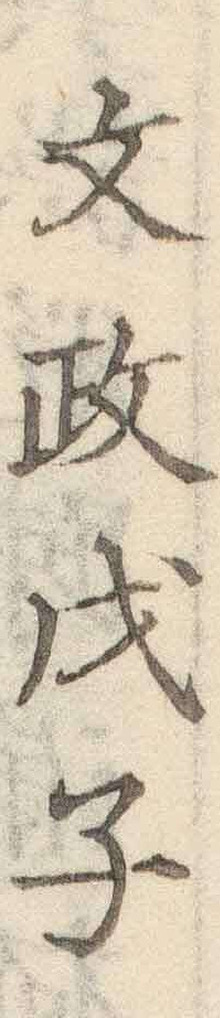文政戊子
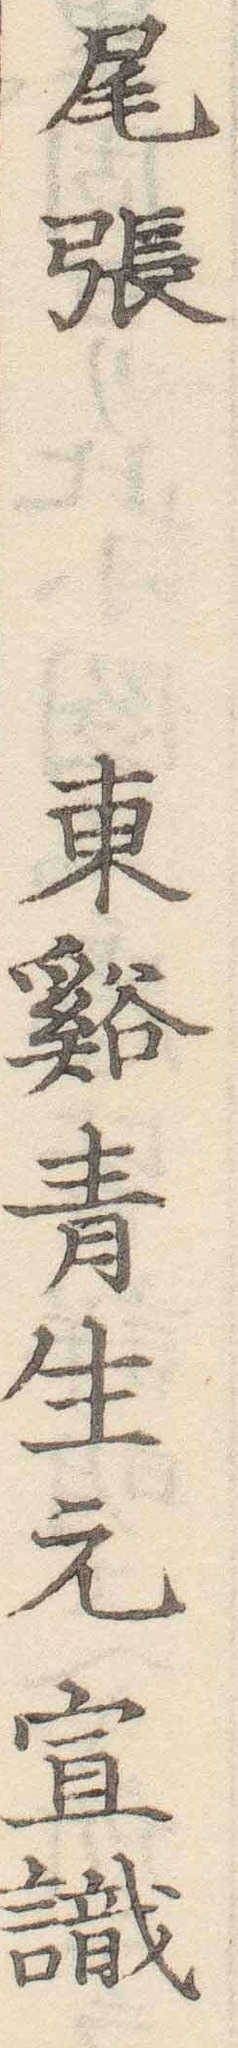尾張東谿青生元宣識
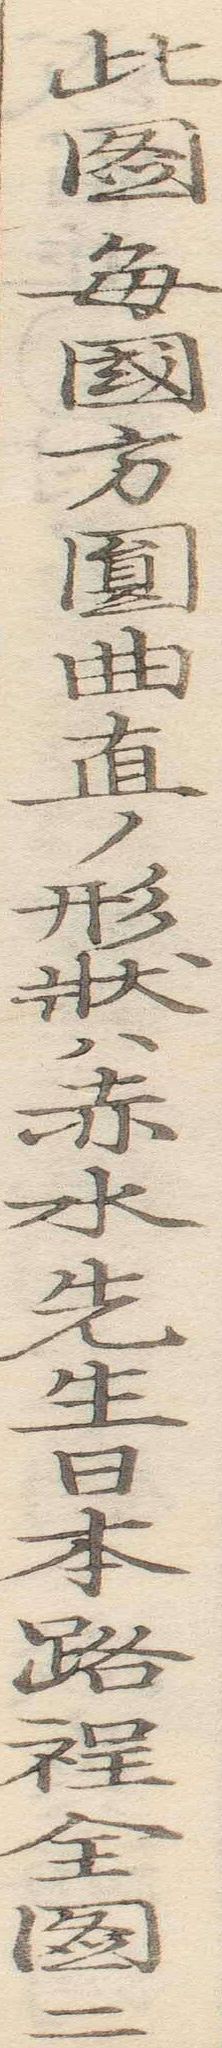此図毎国方円曲直ノ形状ハ赤水先生日本路程全図ニ
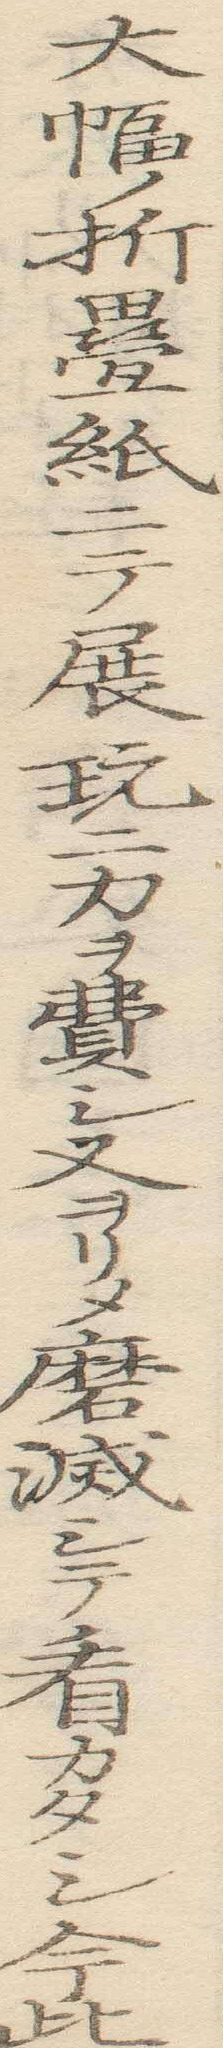大幅ノ折畳紙ニテ展玩ニ力ヲ費シ又ヲリメ摩滅シテ看カタシ今此
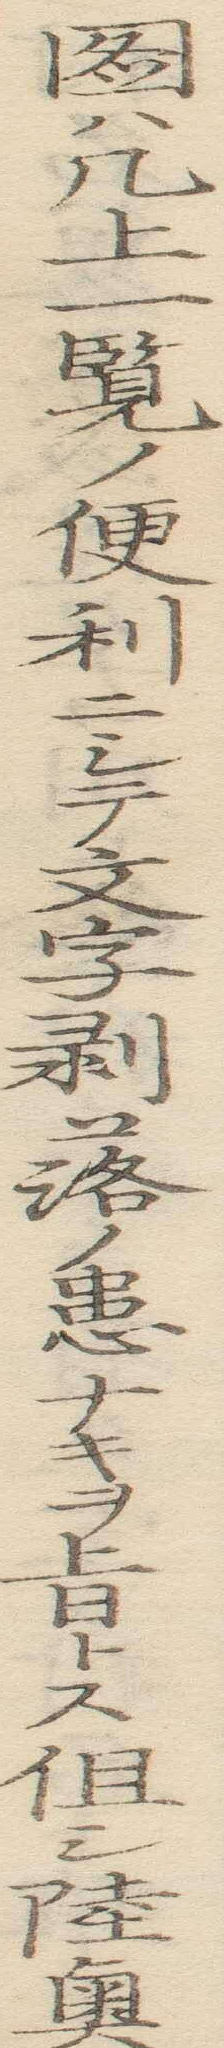図ハ几上一覧ノ便利ニシテ文字剥落ノ患ナキヲ旨トス但シ陸奥
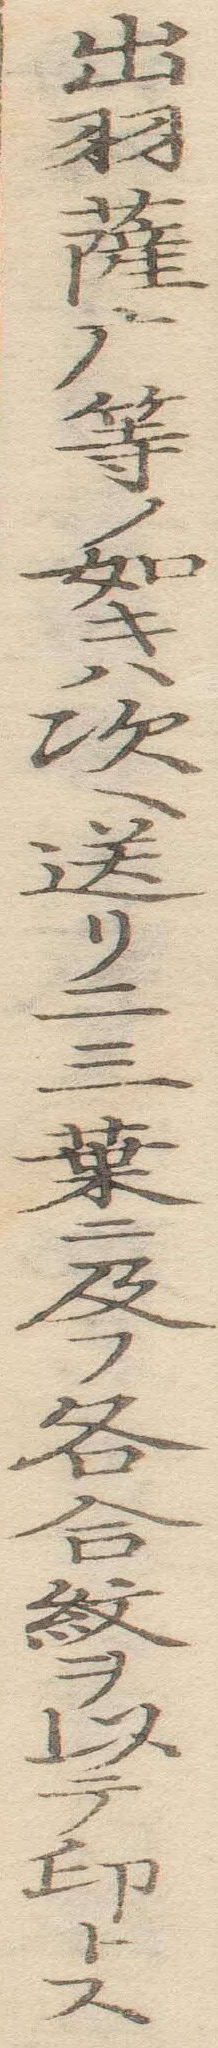出羽薩摩等ノ如キハ次ヘ送リ二三葉ニ及フ各合紋ヲ以テ印トス

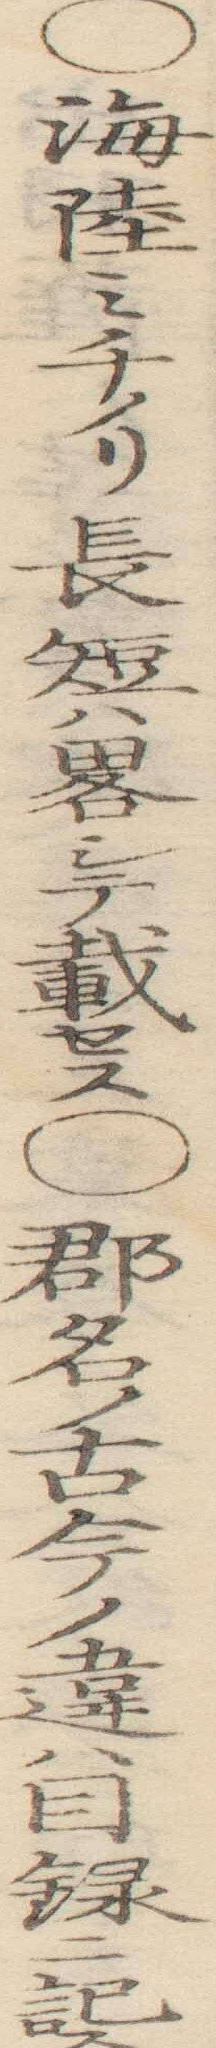○海陸ミチノリ長短ハ略シテ載セス○郡名ノ古今ノ違ハ目録ニ記ス
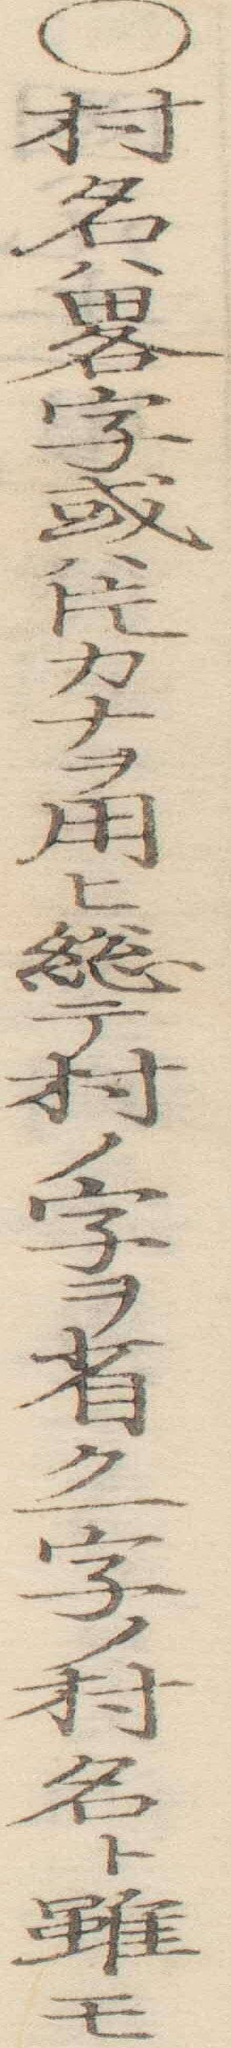○村名ハ略字或ハ片カナヲ用ヒ総テ村ノ字ヲ省ク一字ノ村名ト雖モ
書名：国郡全図
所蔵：東京学芸大学附属図書館 国文学研究資料館
